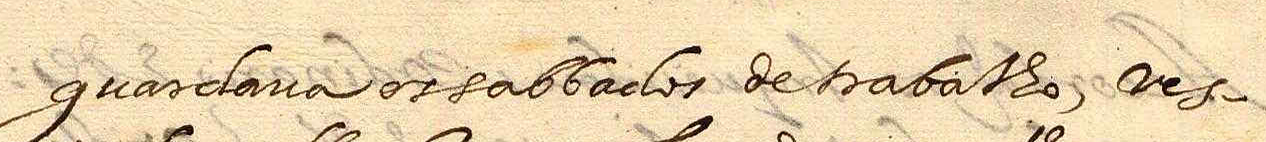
guardaua os sabbados de trabalho, ves
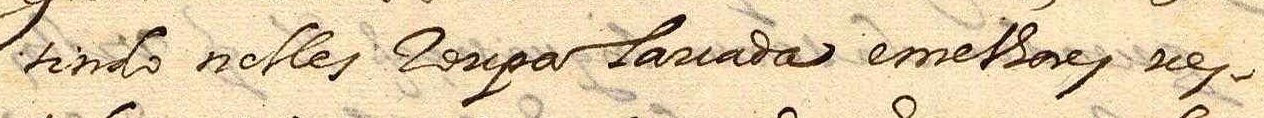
tindo nelles roupa lauada e melhores ues
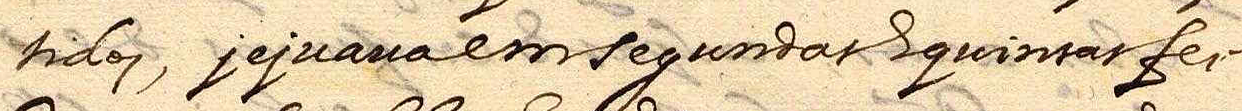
tidos, jejuaua em segundas E quintas fei
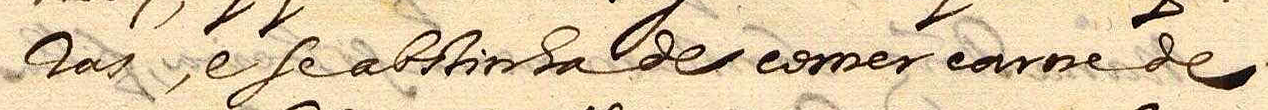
ras, e se abstinha de comer carne de
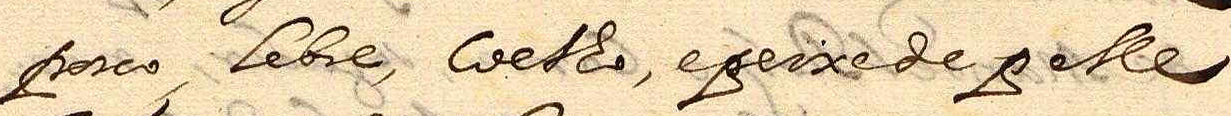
porco, lebre, coelho, e peixe de pelle
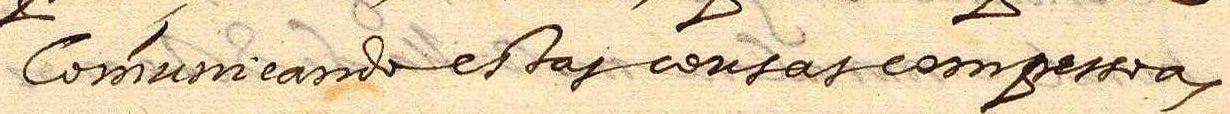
comunicando estas cousas com pessoas
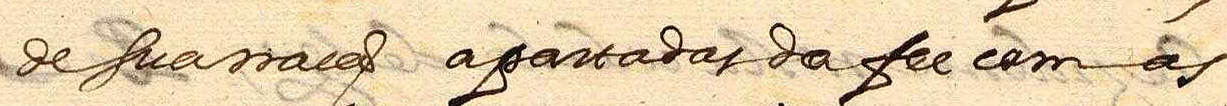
de sua nacaõ apartadas da fee com as
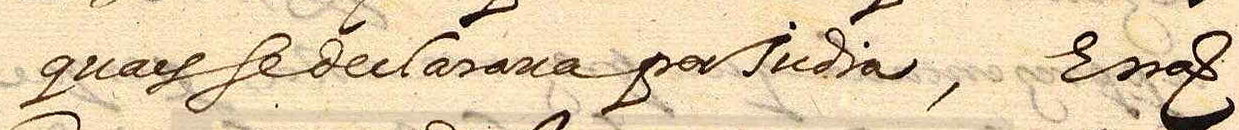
quaes se declaraua por Iudia, E naõ
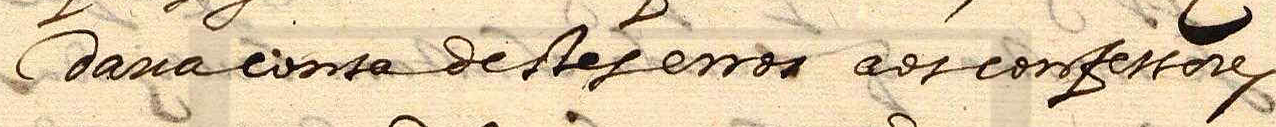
daua conta destes erros aos confessores
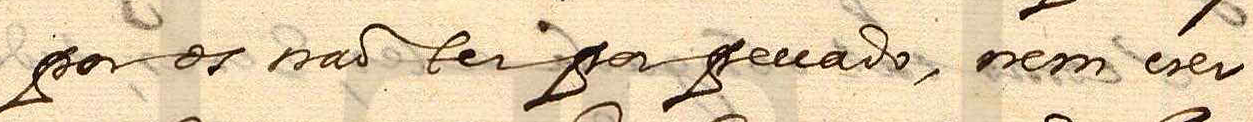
por os naõ ter por peccado, nem crer
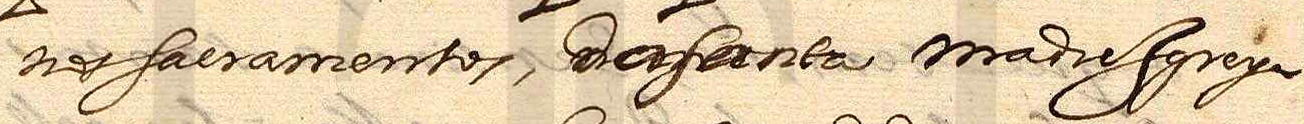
nos sacramentos, de santa madre Jgreya
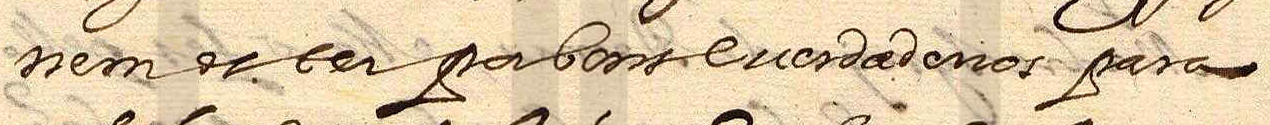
nem os ter por bons e uerdadeiros para
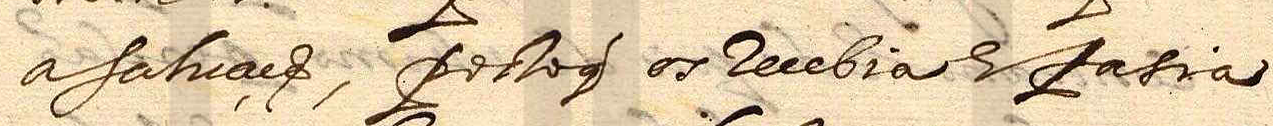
a saluaçaõ, posto q̄ os recebia E fasia
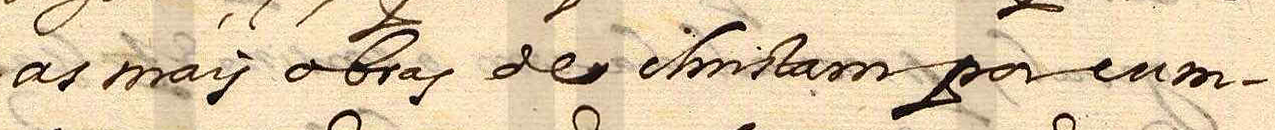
as mais obras de christam por cum
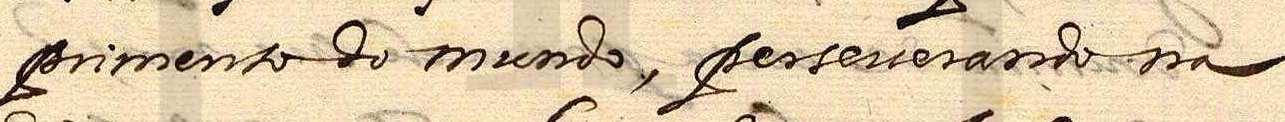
primento do mundo, perseuerando na
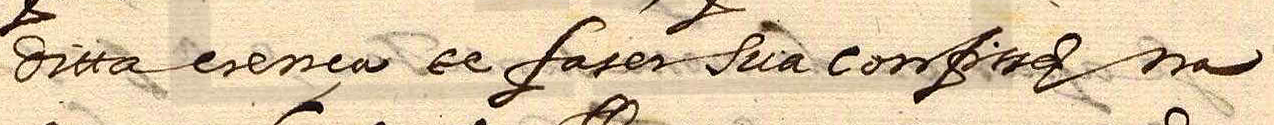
ditta crença te faser sua confissaõ na
